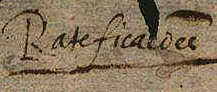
Rateficacões
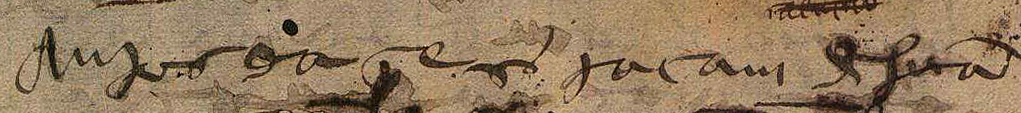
Autos dap̄esētacam de huā
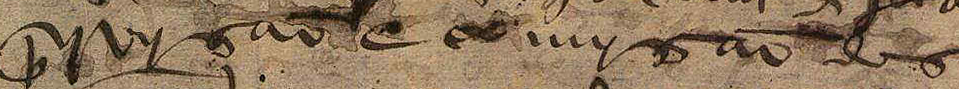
p̄yvysaõ e comysão dos
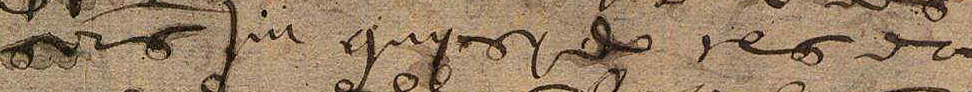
sor̄s Jmquysydores da
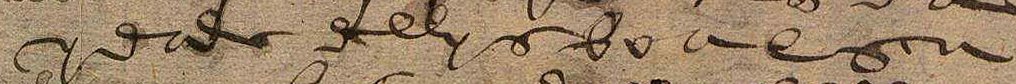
cydade de llysboa e seu
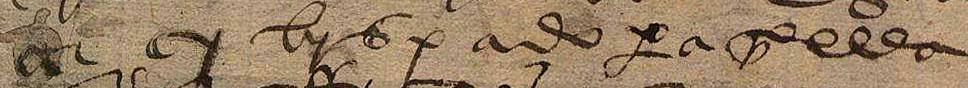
arcybyspado ꝑa p̄o ella
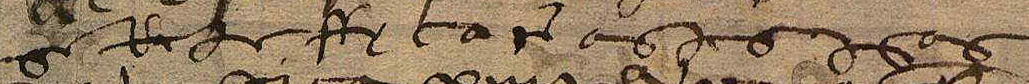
se Rateffycarē as testas
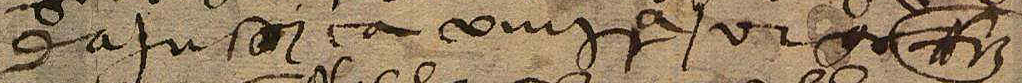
da Justyca comtra Jorge ffrz̄
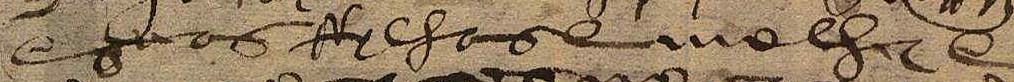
e suas ffylhas e molher e
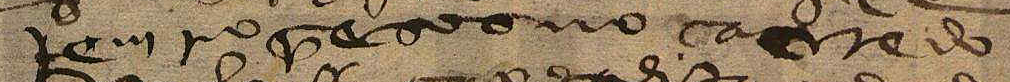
Jemro p̄esos no cacere do
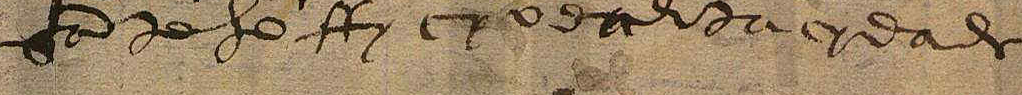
sāto hoffycyo da dita cydade
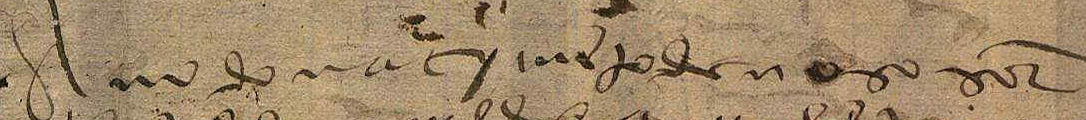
Ano do nacymēto de noso sor̄
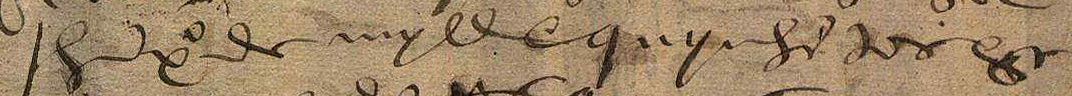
Jhū xo de myll e quynhētos e se
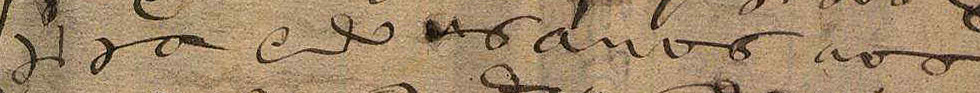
tēta e dous anos aos
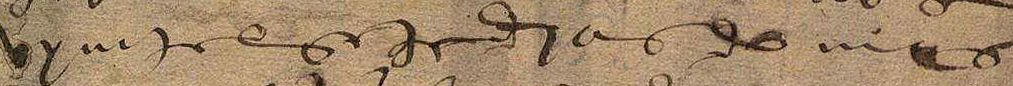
vymte e sete djas do mes
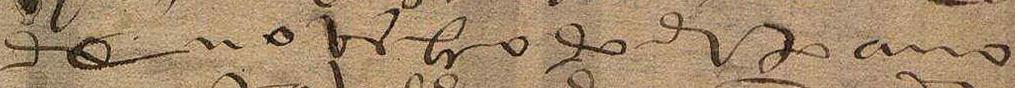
de novēbro do djto ano
